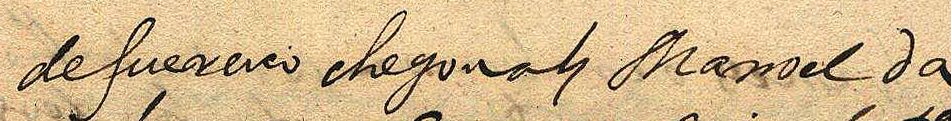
de fuereiro chegou alj Manoel da
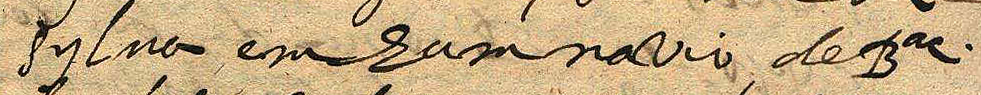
sylua em hum navio de Bar
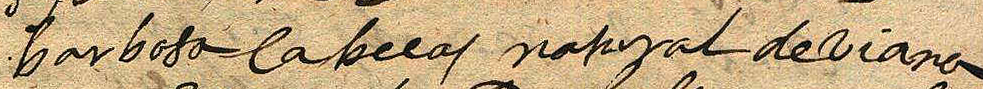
barbosa Cabeças naturaL de viana
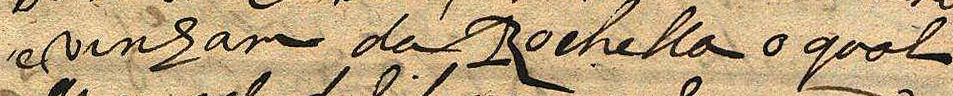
e vinham da Rochella o qual
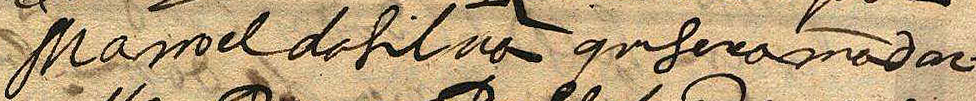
Manoel da Silua quisera mādar
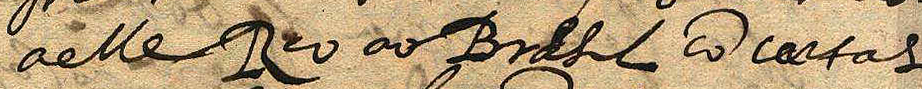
a elle Reo ao BrasiL cō cartas
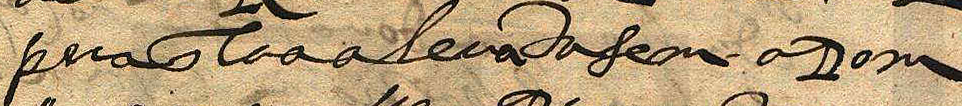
pera q̄ laa aleuātasem a Dom
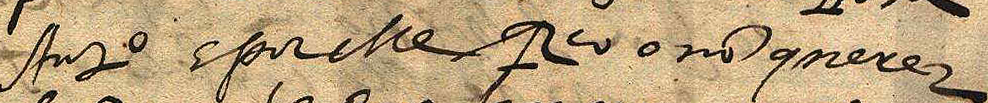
Anto E por elle Reo o nō querer
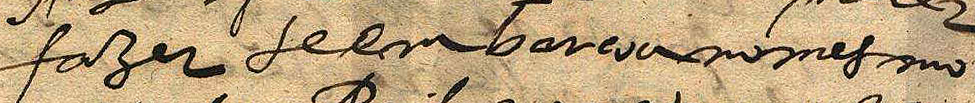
fazer se embarcou no mesmo
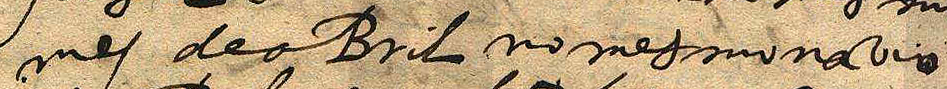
mes de aBriL no mesmo navio
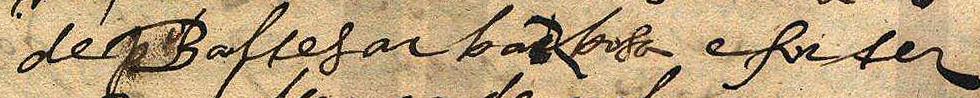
de Baltesar barbosa e foi ter
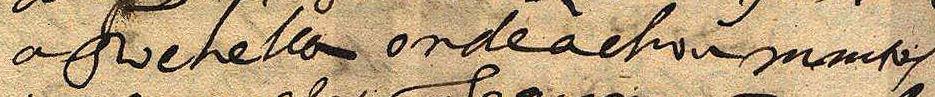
a Rochella onde achou muitos
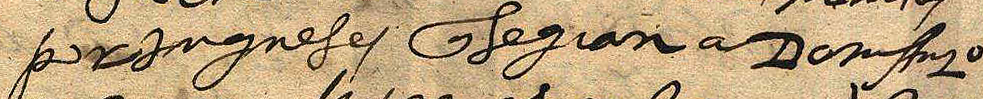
portugueses q̄ segiam a Dom Anto
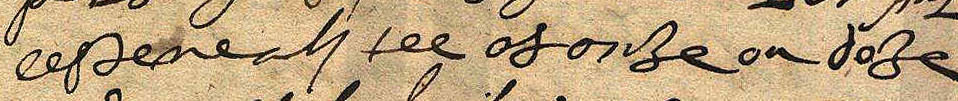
e esteue alj tee os onze ou doze
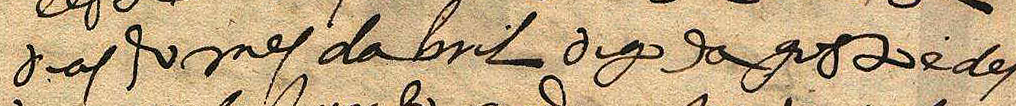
dias do mes dabriL digo dagosto des
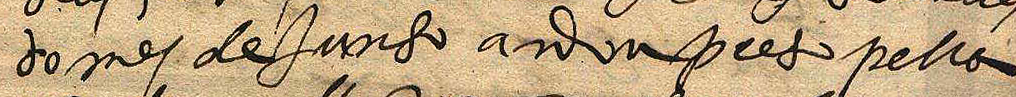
do mes de Junho andou preso pella
